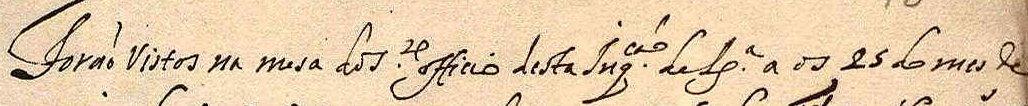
Foraõ vistos na mesa do s.to officio desta Inq.çaõ de Lx.a aos 25 do mes de
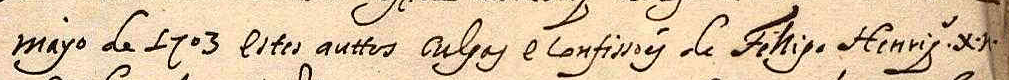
mayo de 1703 estes auttos culpas e confissoẽs de Fellipa Henriq.s x.n.
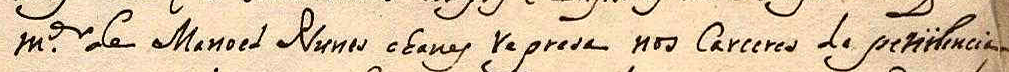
m.er de Manoel Nunes chaues re presa nos Carceres da penitencia
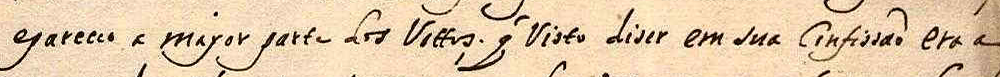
e pareceo a mayor parte dos Vottos; q̄ visto diser em sua Confissaõ era a
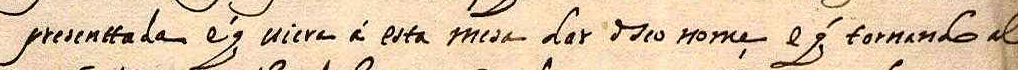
presenttada e q̄ uiera á esta mesa dar o seo nome, e q̄ tornando al
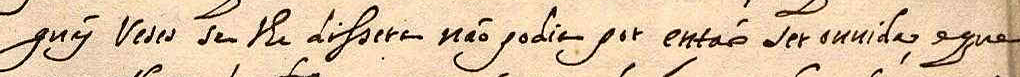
guās Veses se lhe dissera naõ podia por entaõ ser ouuida, e que
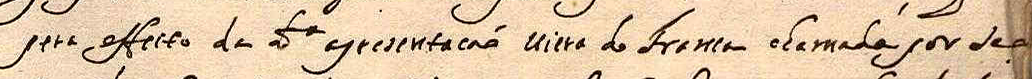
pera effeito da d̄a apresentaçaõ uiera de Franca chamada por seo
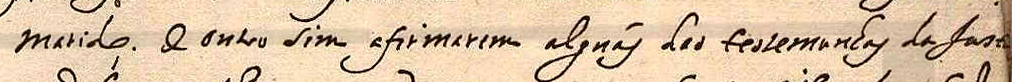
marido; e outrosim afirmarem alguās das testemunhas da Just
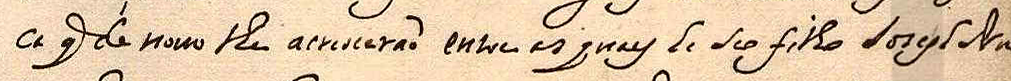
ça q̄ de nouo lhe acresceraõ entre as quaes he seo filho Ioseph Nu
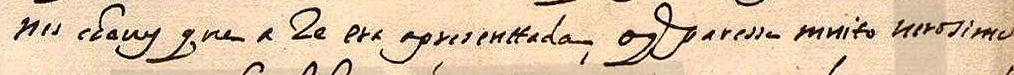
nes chaues que a Re era apresenttada, o q̄ paresse muito uerosime
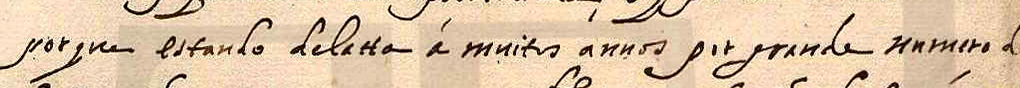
porque estando delatta á muitos annos por grande numero de
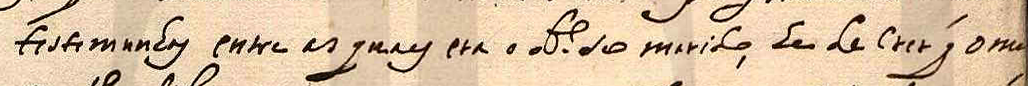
testemunhas entre as quaes era o d̄.o seo marido, he de crer q̄ o me
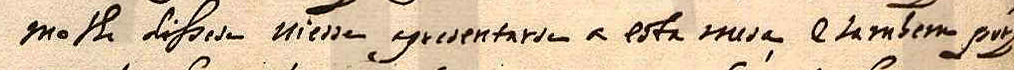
mo lhe dissese uiesse apresentarse a esta mesa, e tambem porq̄
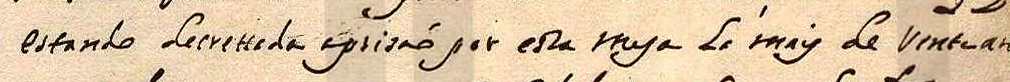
estando decrettada a prisaõ por esta mesa ha mais de vinte an
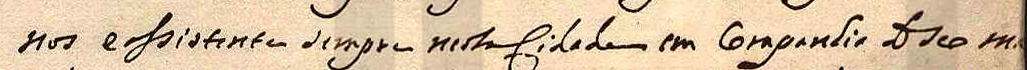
nos e assistente sempre nesta Cidade em companhia d̄ seo ma
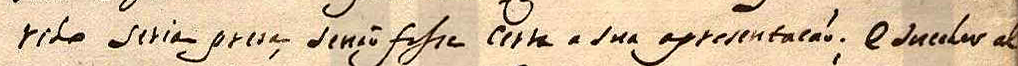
rido seria presa, se naõ fosse certa a sua apresentaçaõ. E suceder al
